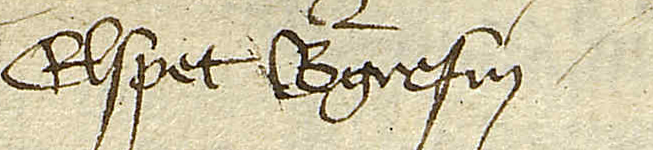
Elſpet B*grefin /
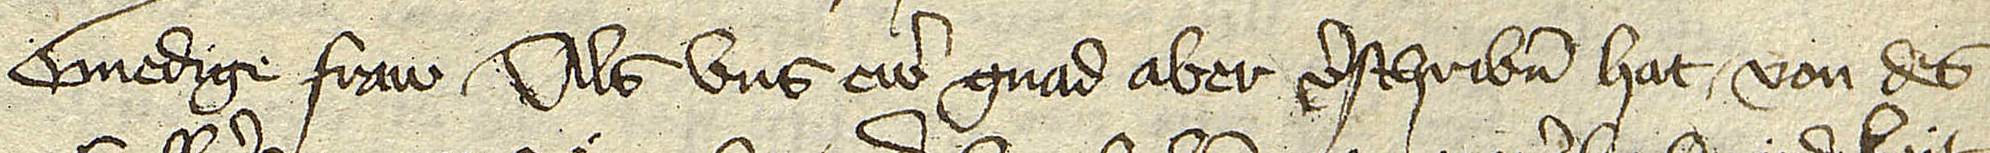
Gnedige fraw / Als vns ew* gnad aber v*ſchribn* hat / von des
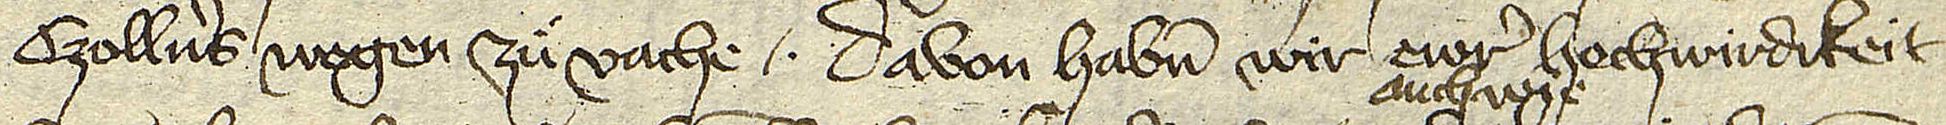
Cʒolln*s wegen cʒü vache / . Davon habn* wir ewr* hochwirdikeit
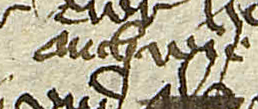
auch wie
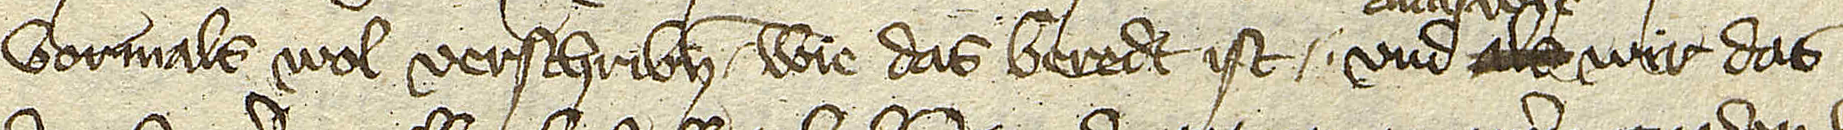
vormals wol verſchribn* / wie das beredt iſt / . vnd als wir das
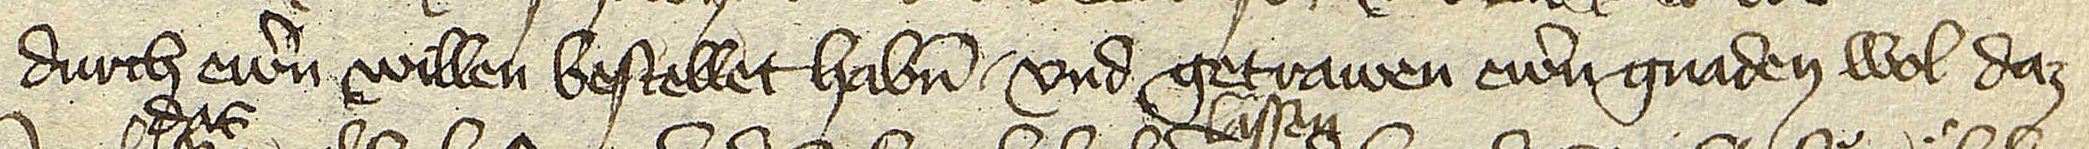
durch ewn* willen beſtellet habn* / vnd getrawen ewn* gnaden wol daʒ
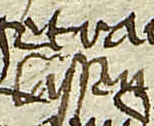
laſſen
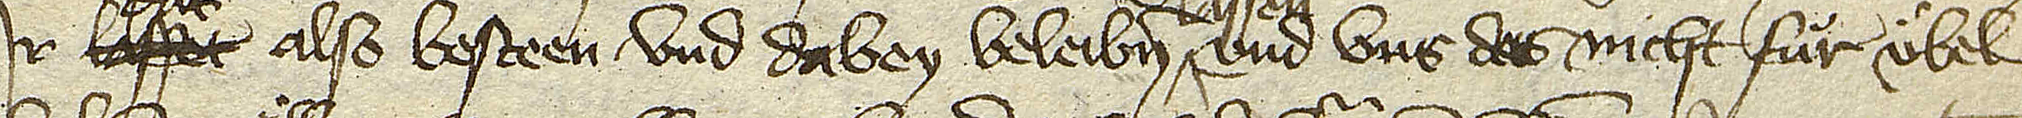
Ir laſſet alſo beſteen / vnd dabey beleibn* vnd vns des nicht für v̈bel
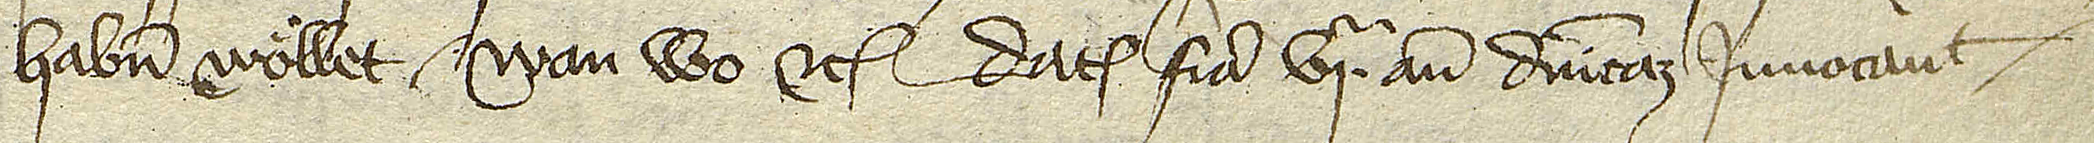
habn* wöllet / wan wo ec* dat* fia* vi* an* d*nica* Inuocaut* /
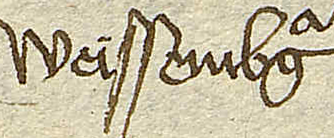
Weiſſemb*g
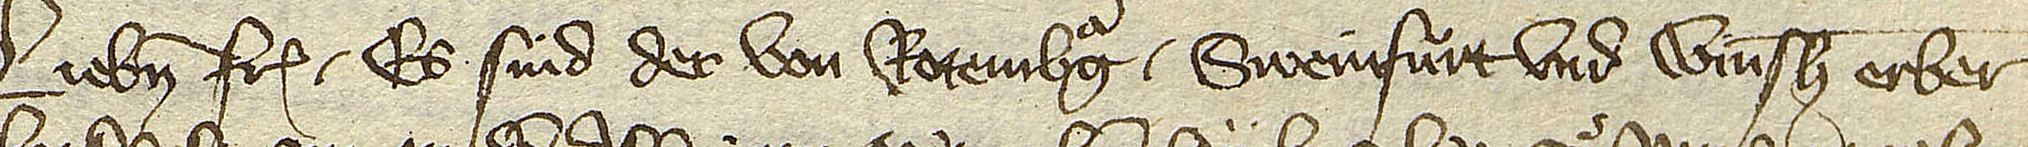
Liebn* fr* / Es ſind der von Rotemb*g / Sweinfurt vnd winſh* erber
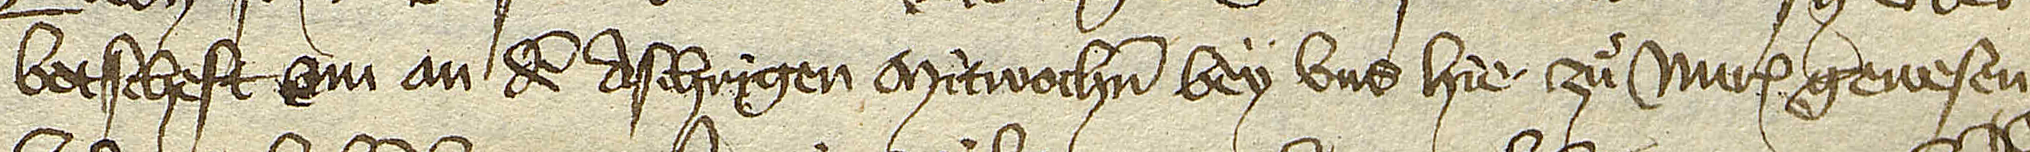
botſcheft nu an d* Aſchrigen Mitwochn* bey vns hie cʒü Nur* geweſen
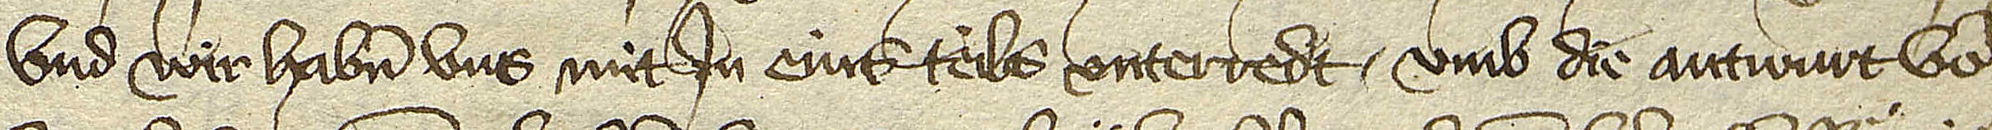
vnd wir habn* vns mit In eins teils vnterredt / vmb die antwurt vo*
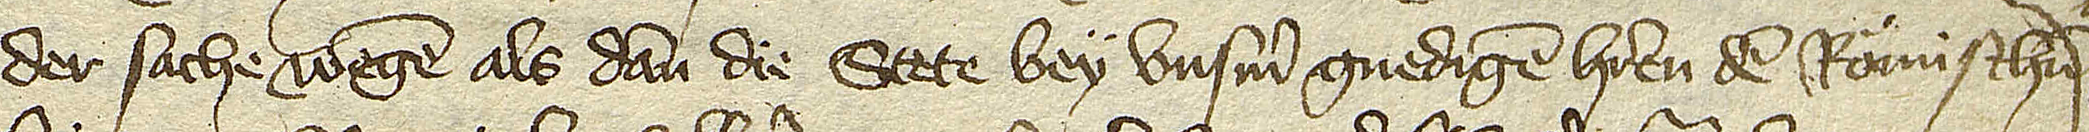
der ſache wege* als dan* die Stete bey vnſm* gnedige* hr*en d* Römiſchn*
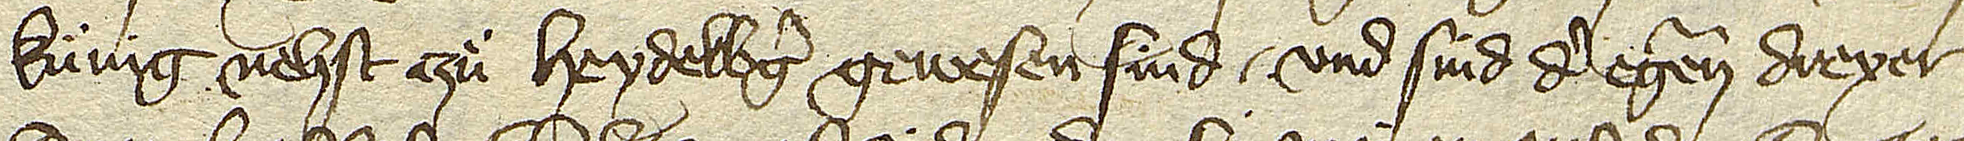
künig nehſt cʒü heydelbg* geweſen ſind / . vnd ſind d* egen* dreyer
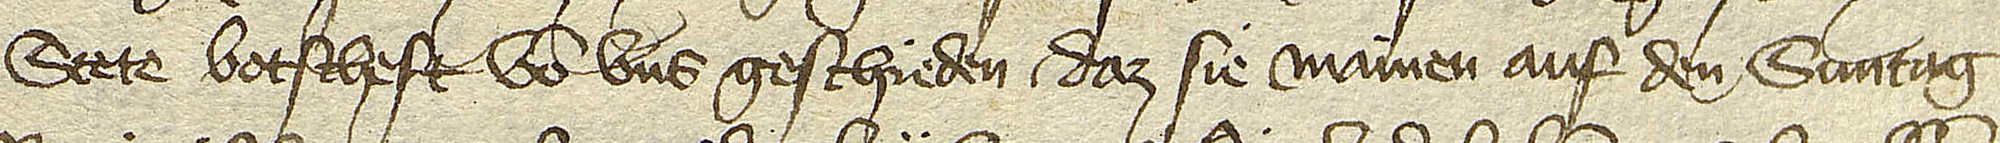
Stete botſcheft vo* vns geſchieden / daʒ ſie mainen auf den Suntag
